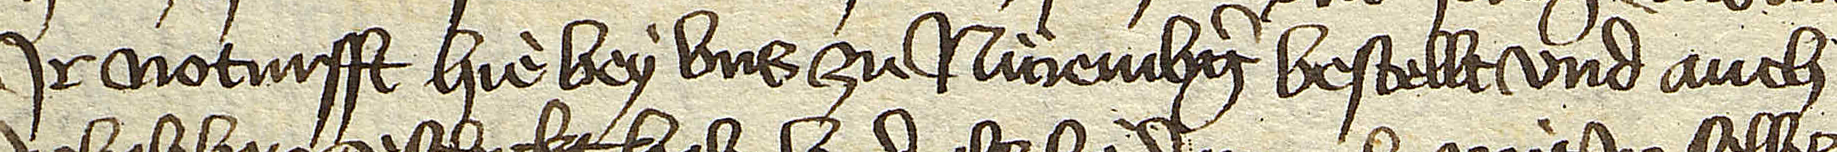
Ir noturfft hie bey vns cʒu Nürembg* beſtellt vnd auch
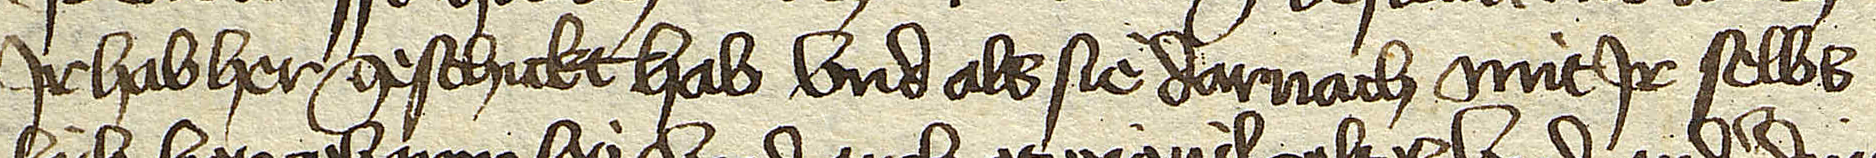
Ir hab her geſchickt hab vnd als ſie darnach mit Ir ſelbs
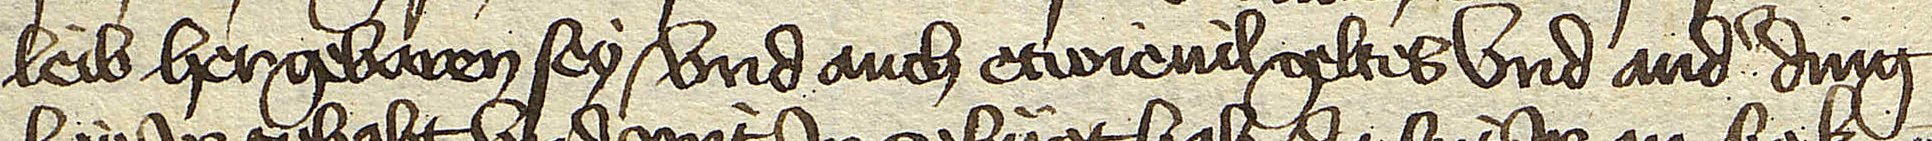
leib hergevaren ſey / vnd auch etwieuil gelts vnd and* ding
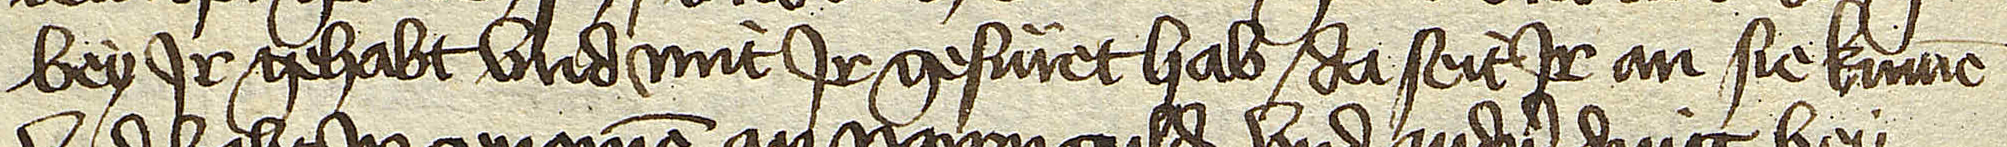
bey Ir gehabt vnd mit ir gefüret hab / da ſeit Ir an ſie kume*
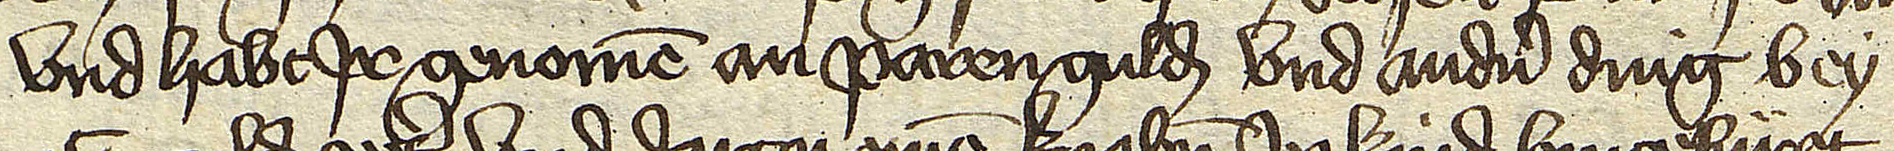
vnd habt Ir genome* an Paren guld* vnd andn* ding bey
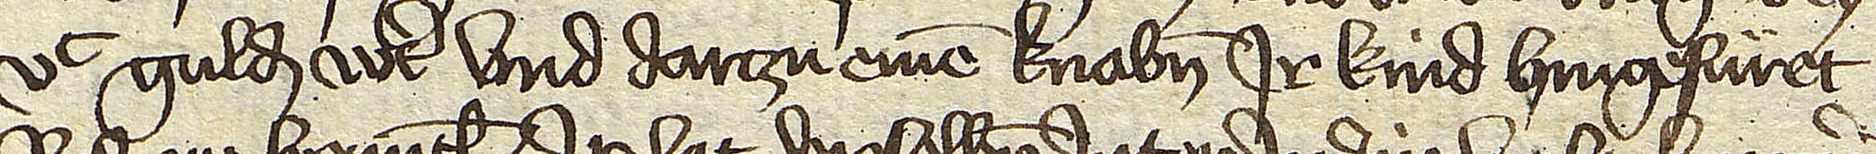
v* guld* w*t vnd darcʒu eine* knabn* Ir kind hingefüret
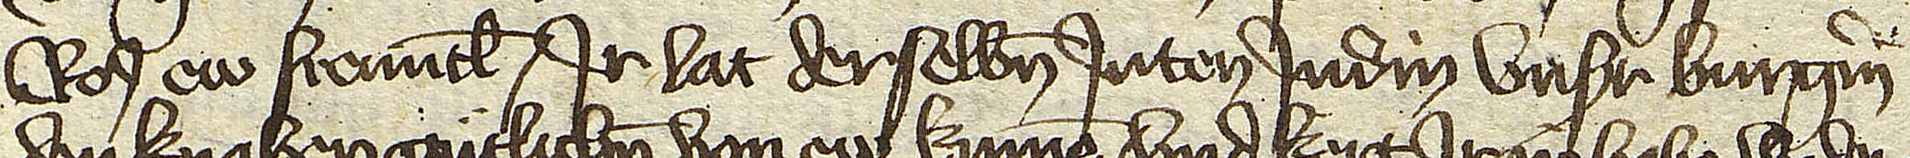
Ro* ew freuntl* / Ir lat derſelbn* Iuten Iudin vnſ*r burg*in
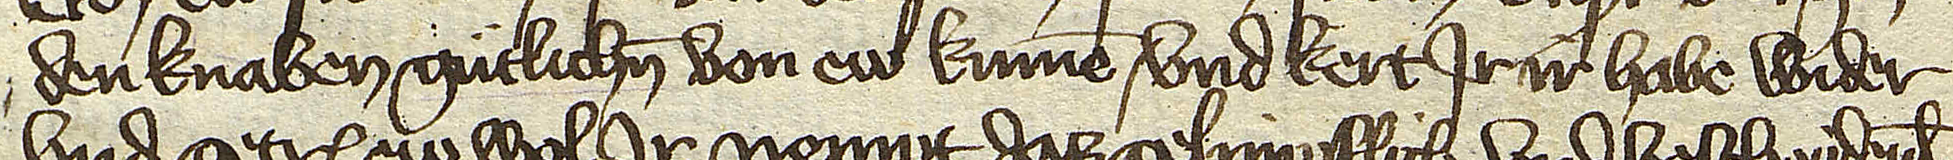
den knaben gütlichn* von ew kume* / vnd kert Ir ir habe wider
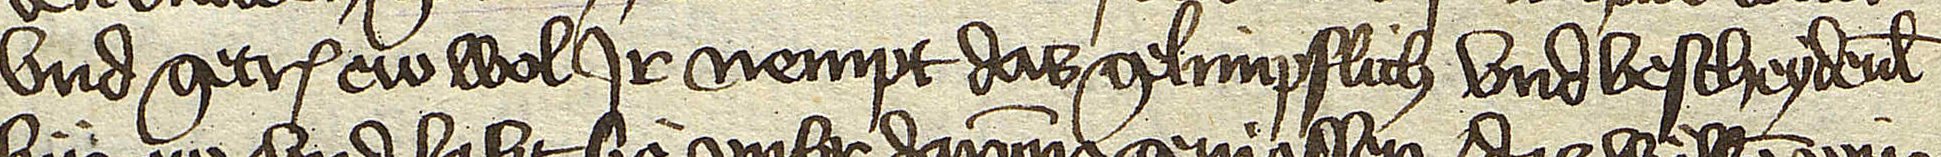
vnd getr* ew wol Ir nempt das gelimpflich vnd beſcheydenl*
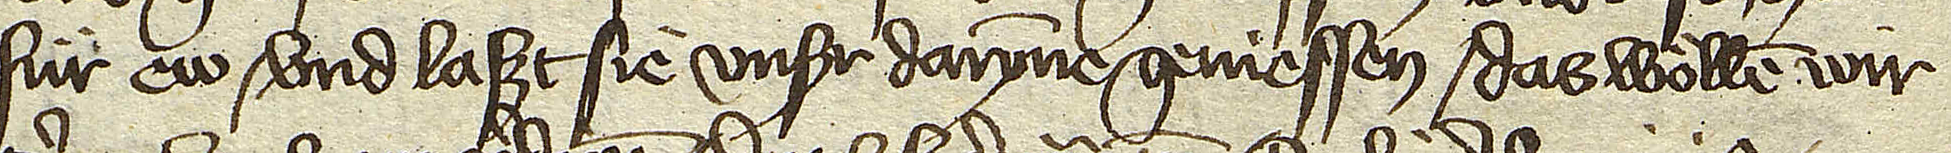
für ew / vnd laſʒt ſie vnſ*r daryne* genieſſen / das wölle* wir
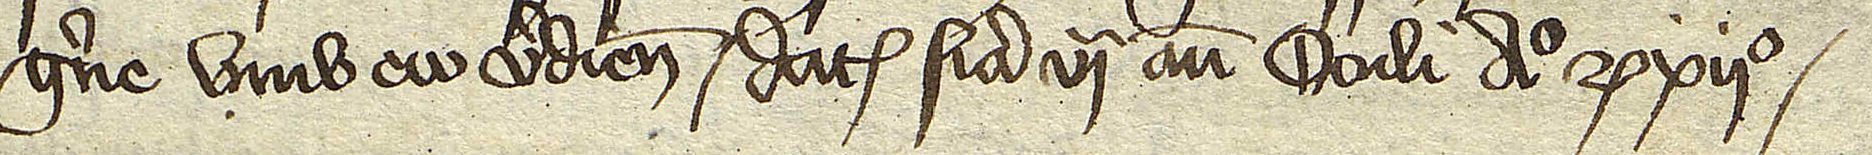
g*ne vmb ew v*dien* / dat* fia* vi* an* Oculi A* ec* xii* /
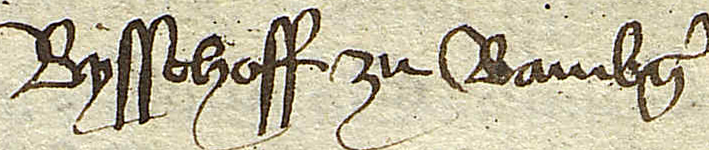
Byſſchoff cʒu Bambg*
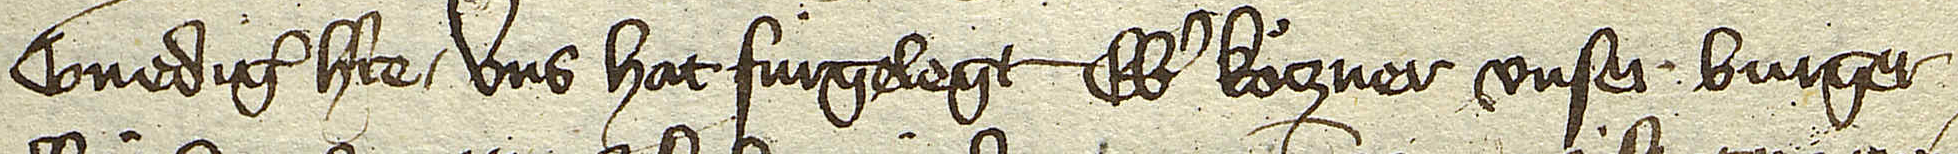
Gnedig* h*re / vns hat fürgelegt Eb* köcʒner vnſer burger
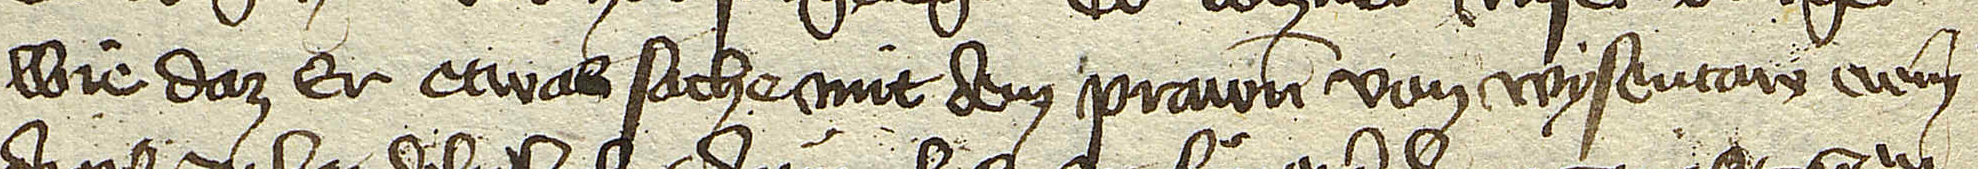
wie daʒ Er etwas ſache mit dem Prawn* von wyſentaw ewm*
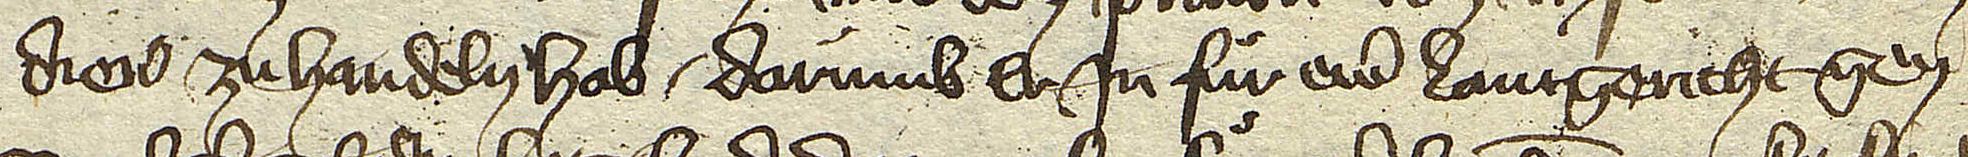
dien* cʒu handeln hab / darümb Er In für ew* Lantgericht gen
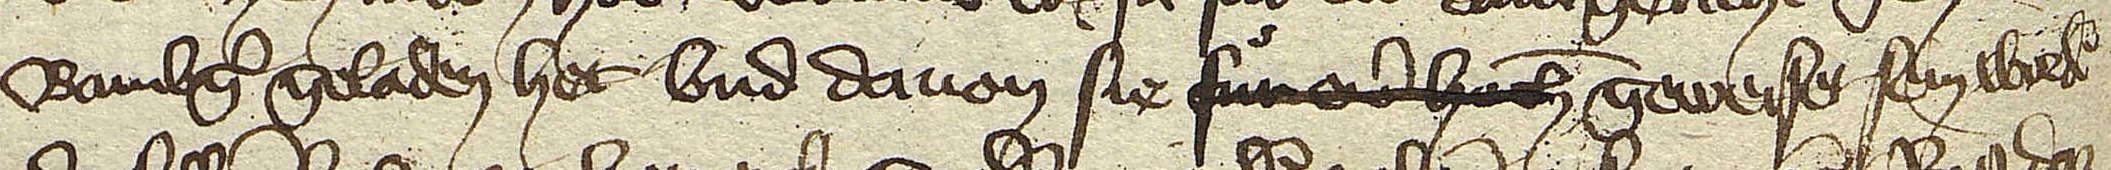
Bambg* geladen het vnd dauon ſie für ew* hoch* geweiſet ſein word*
